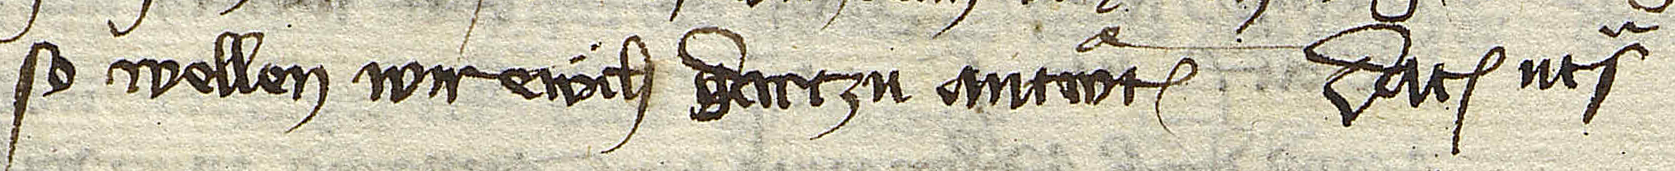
ſo wellen wir ewch darcʒu antw*t Dat* ut ſ*
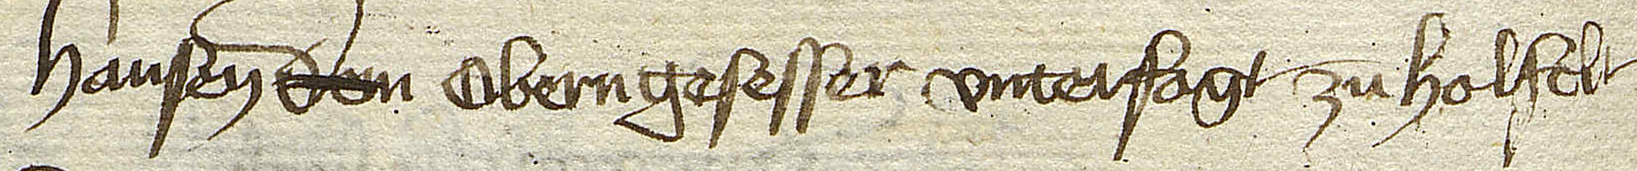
Hanſen Dem Oberngeſeſſer vnterfogt cʒu holfelt
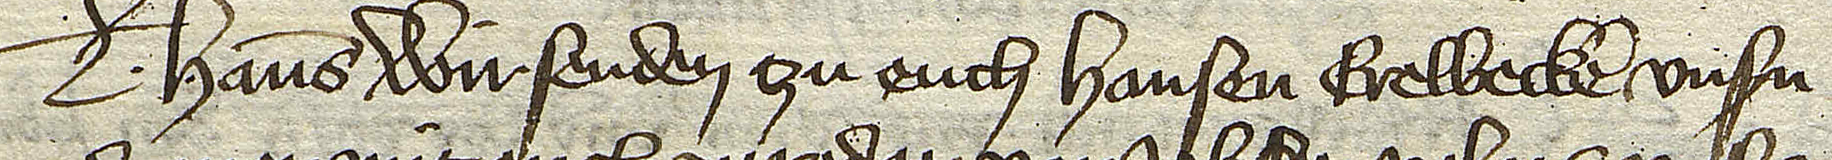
L* . hans* wir ſenden cʒu euch hanſen Erelbecke* vnſ*n
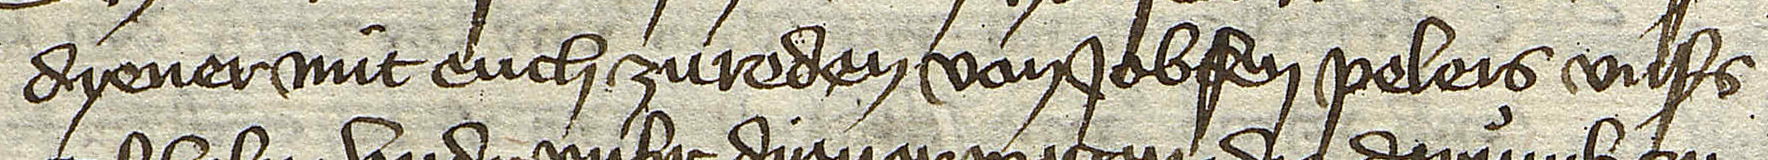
dyener mit euch cʒu reden von Iobſen pelers vnſ*s
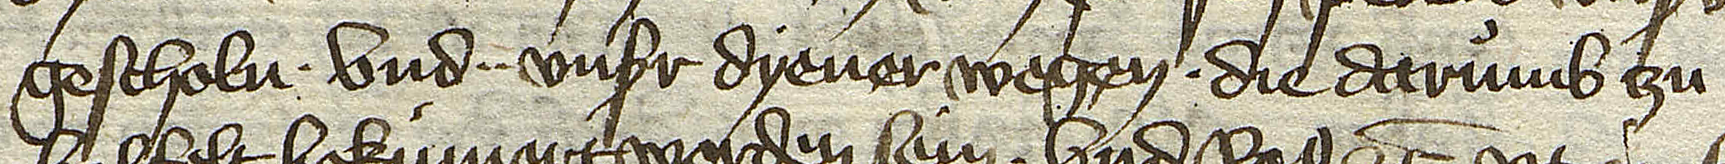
geſcholn . vnd ~ vnſ*r dyener wegen . die darümb cʒu
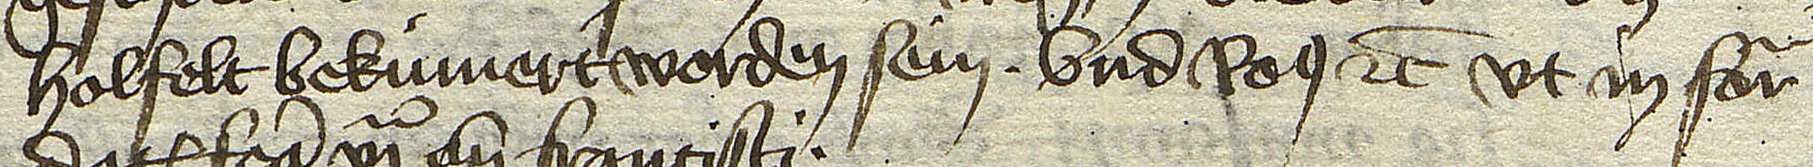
holfelt bekümert worden ſein . vnd Ro* ec* vt in for*
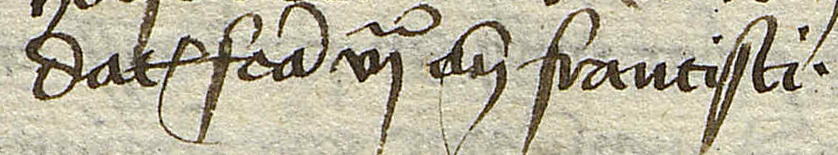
dat* fea* vi* an* franciſci
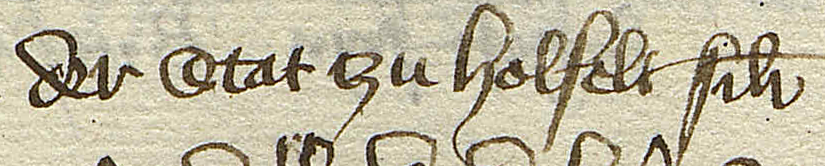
der Stat cʒu holfelt ſilr*
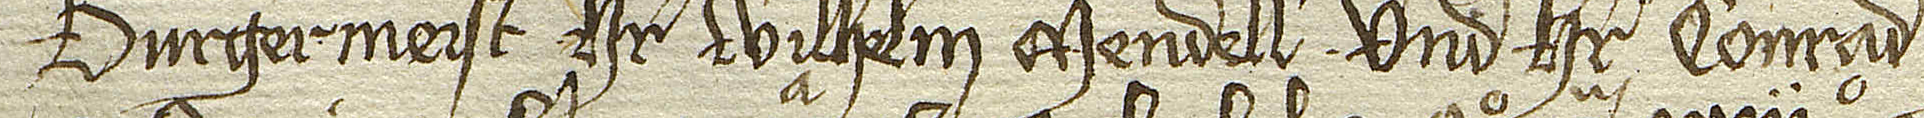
Burgermeiſt* Hr* Wilhelm Mendell . Vnd Hr* Conrad
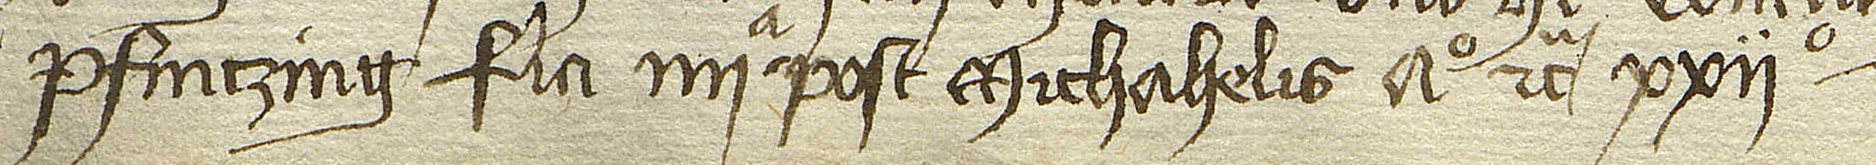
Pfincʒing fia* iiii* poſt Michahelis A* ec* xxii* /
